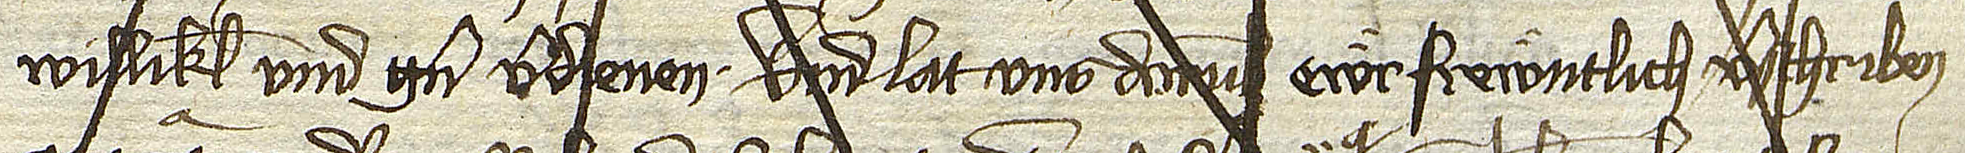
willikl* vnd g*n v*dienen . Vnd lat vns daru*b ewr frewntlich v*ſchriben
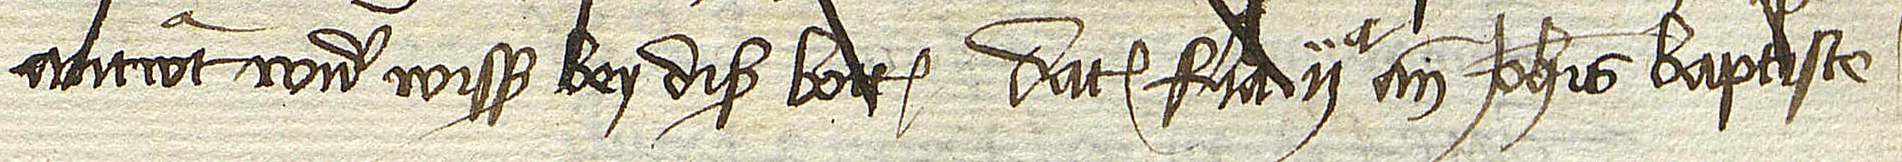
antw*t wid* wiſſ* bey diſ* bott* Dat* fia* ii* an* Ioh*is baptiſte
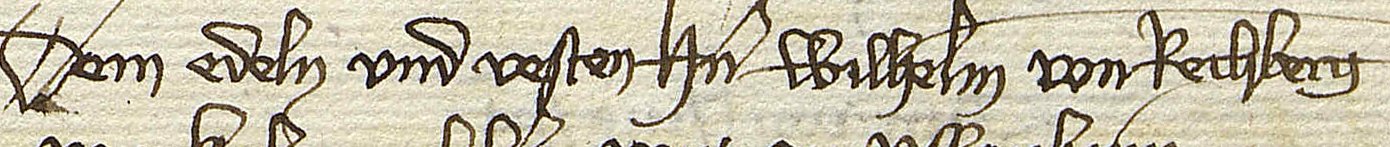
Dem edeln vnd veſten H*n Wilhelm* von Rechberg
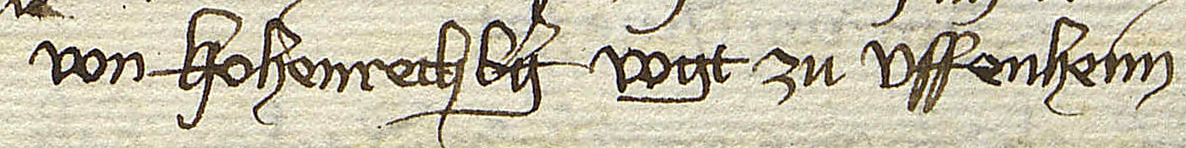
von Hohenrechb*g vogt ʒu Vffenheim
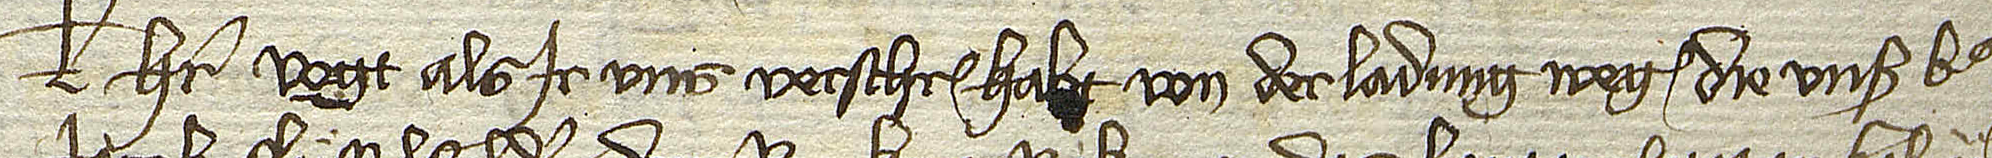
L* h*r vogt als Ir vns verſchr* habt von der ladung weg* die vnſ* b*
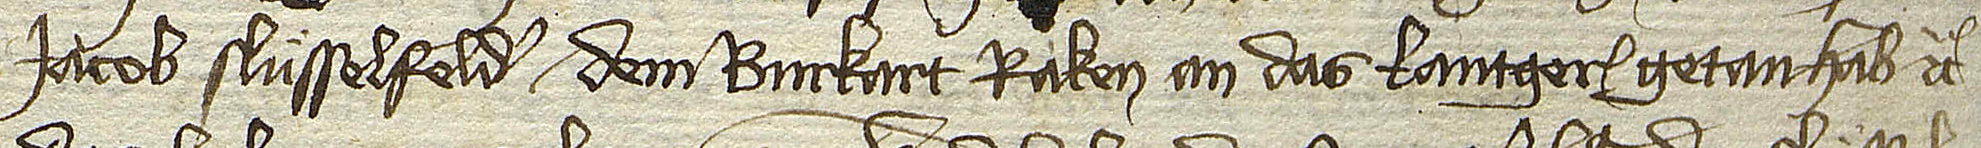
Iacob ſlüſſelfeld* / dem Burkart Raken an das lantger* getan hab ec*
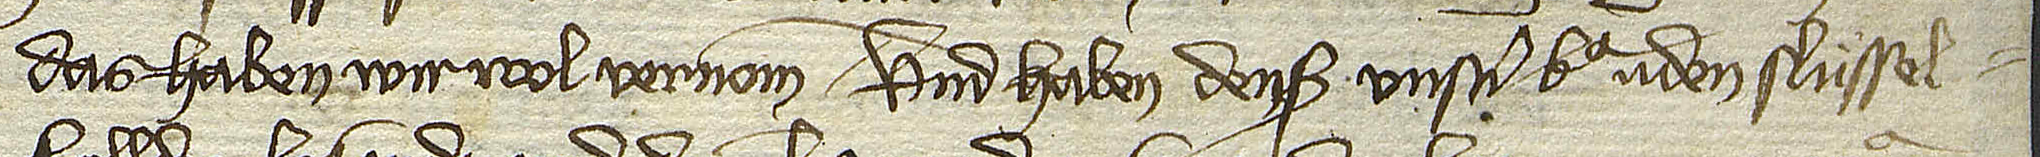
das haben wir wol vernom* / Vnd haben denſ* vnſ*n b* ~ den ſlüſſel =
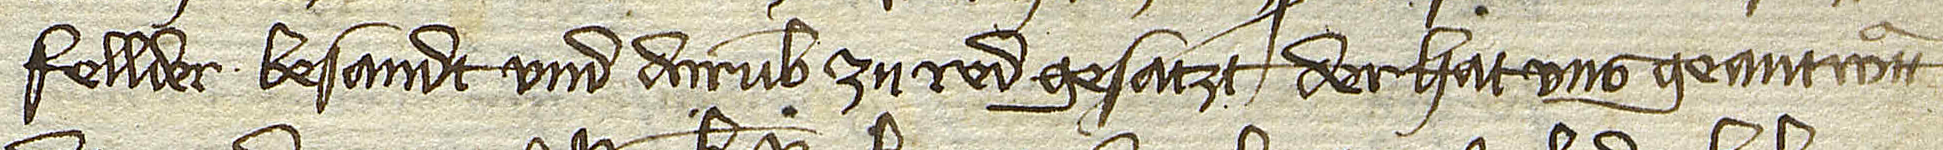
fellder . beſandt vnd daru*b ʒu red geſacʒt der hat vns geantw*tt
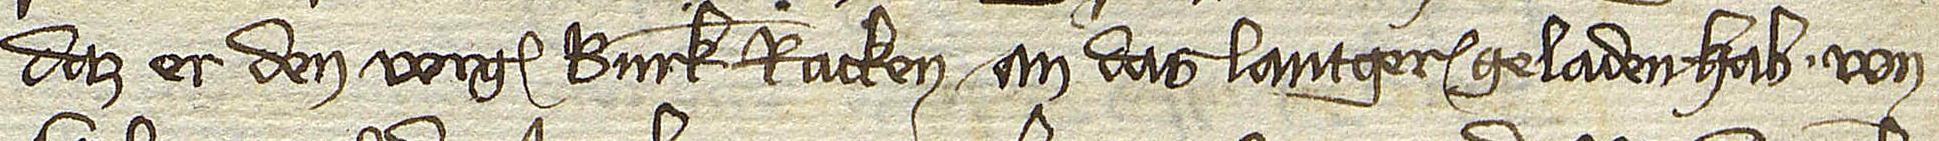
daʒ er den vorg* Burk* Racken / an das lantger* geladen hab . von
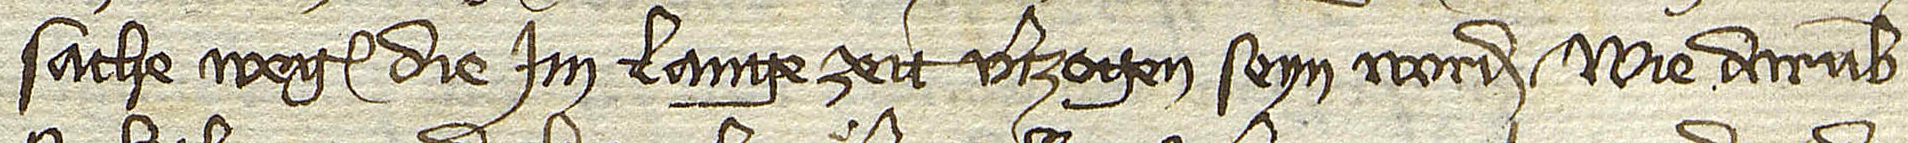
ſache weg* die Im lange ʒeit v*cʒogen ſeyn word* / wie daru*b
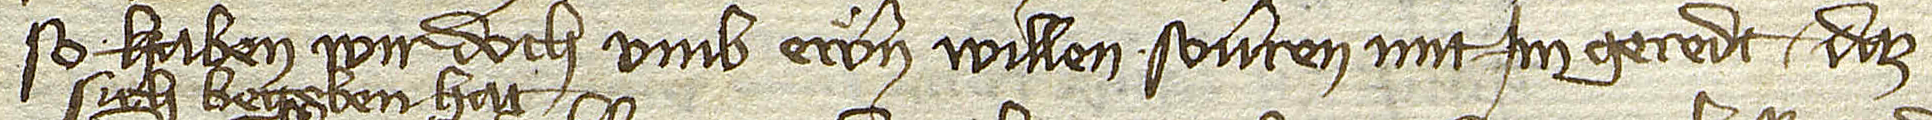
ſo haben wir doch vmb ew*n willen ſou*ren mit Im geredt / daʒ
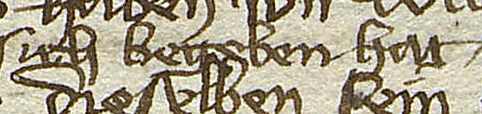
ſich begeben hat
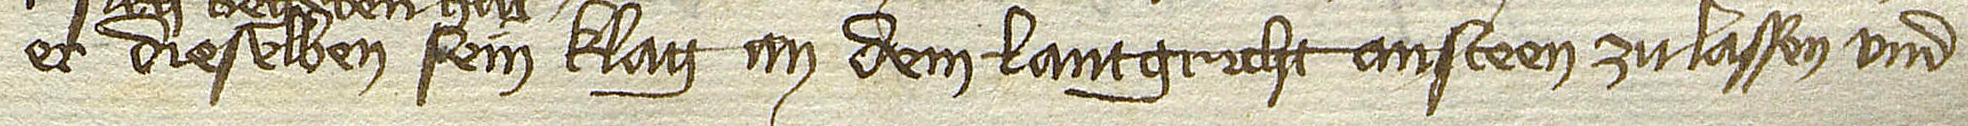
er dieſelben ſein klag an dem lantgricht anſteen ʒu laſſen vnd
